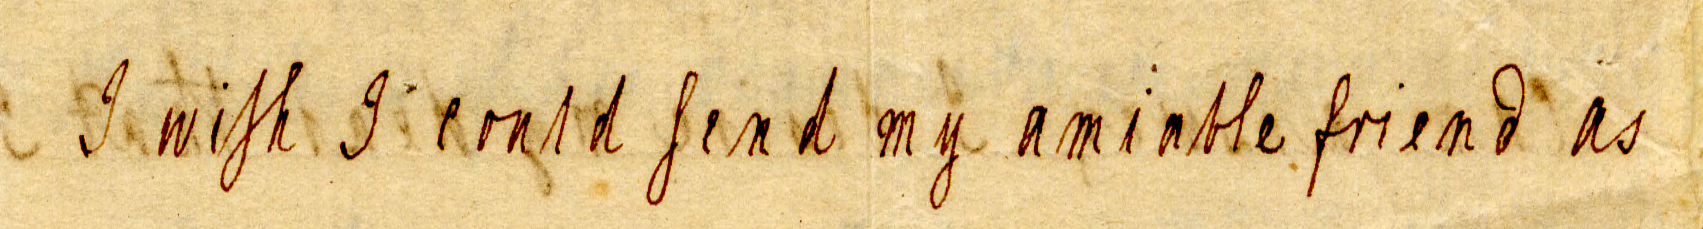I wish I could send my amiable friend as
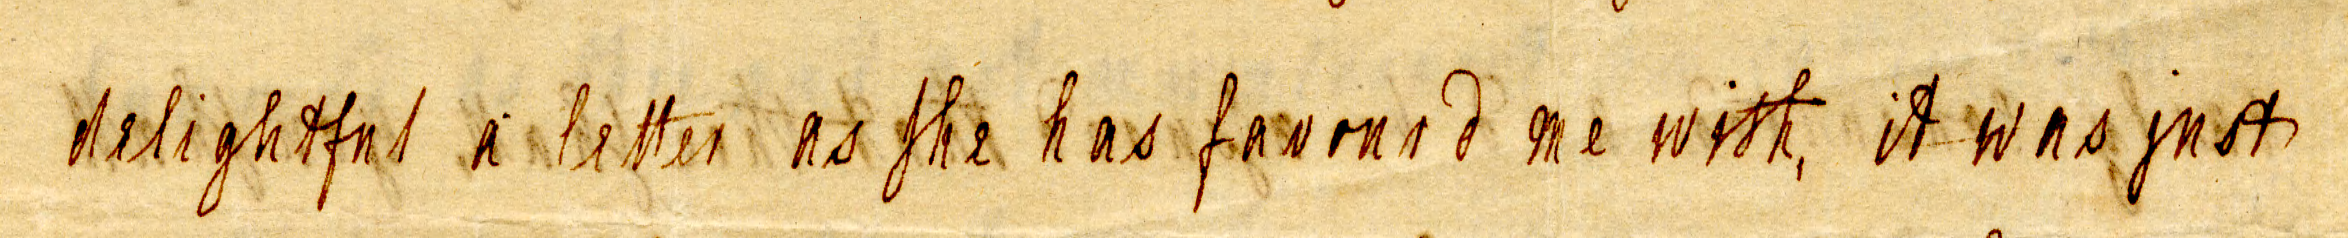delightful a letter as she has favourd me with, it was just
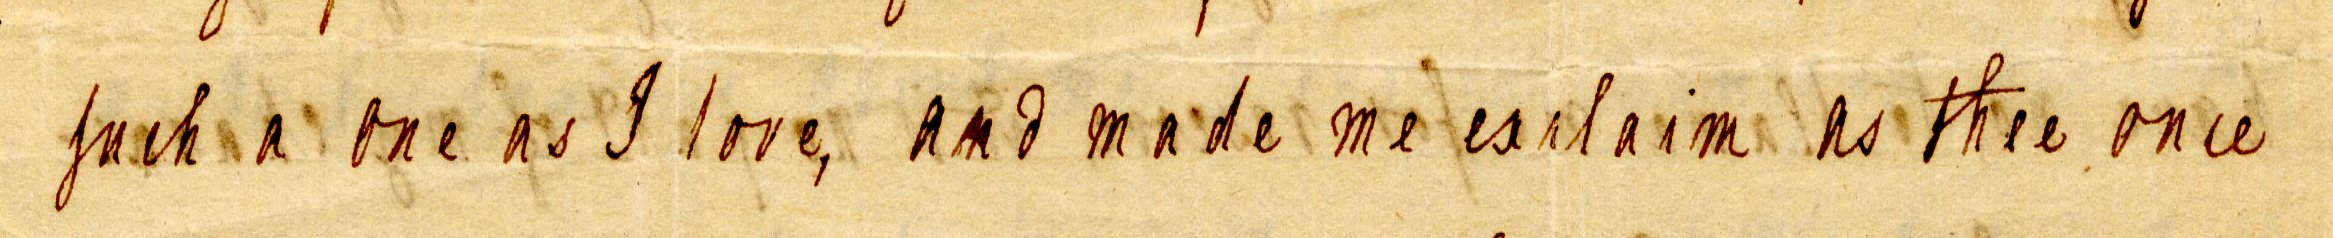such a one as I love, and made me exclaim as thee once
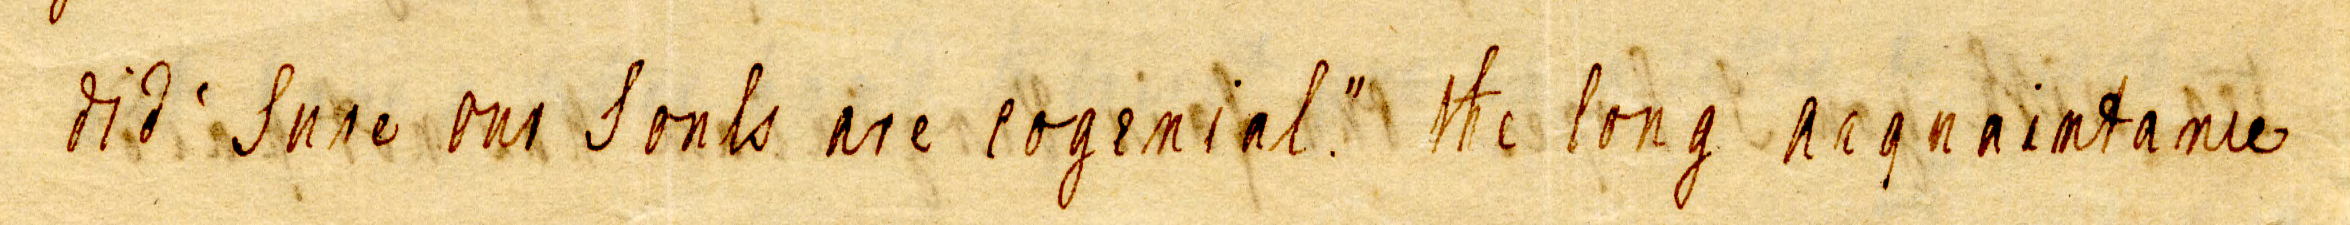did 'sure our souls are cogenial." the long acquaintance
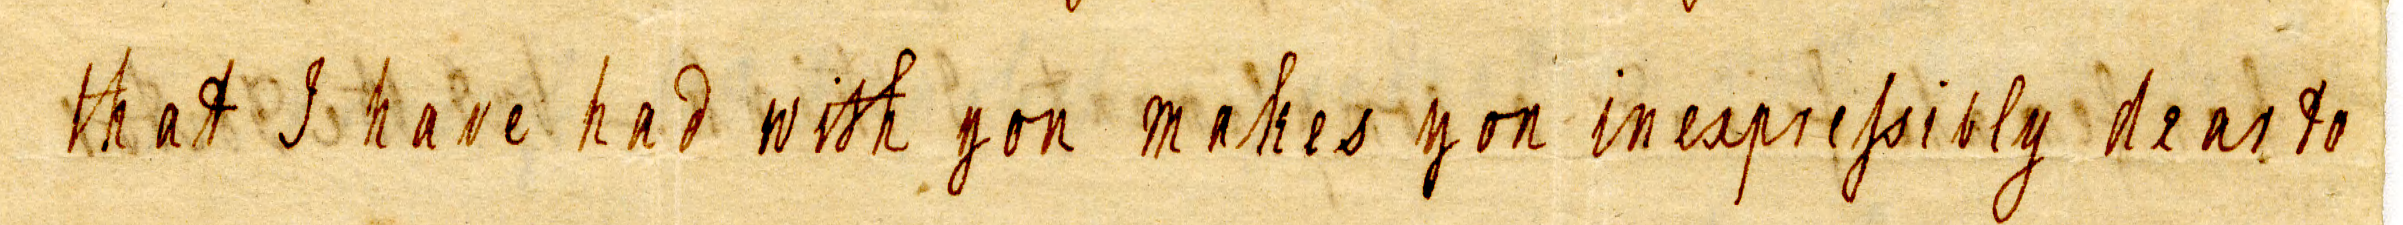that I have had with you makes you inexpressibly dear to
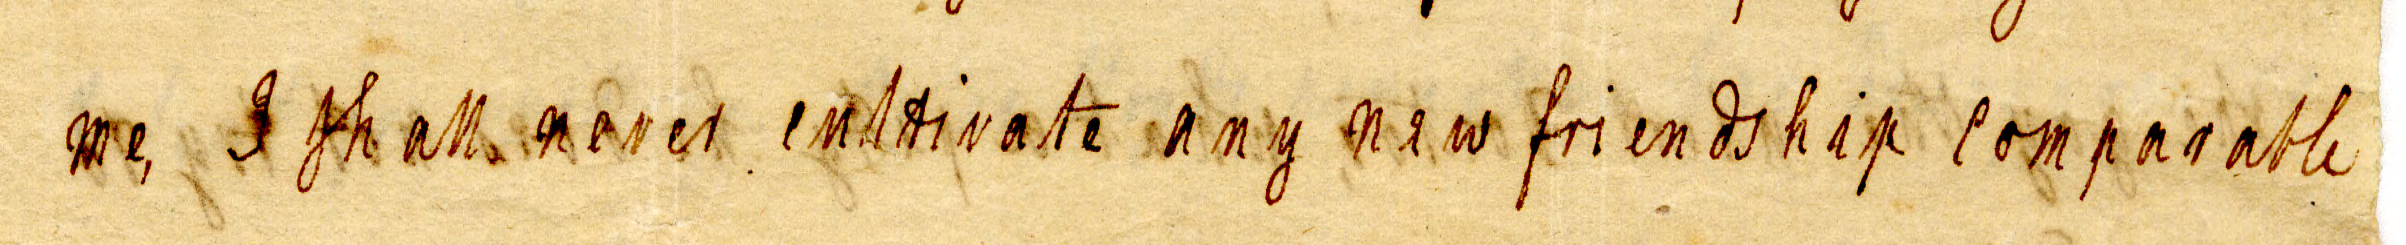me, I shall never initiate any new friendships comparable
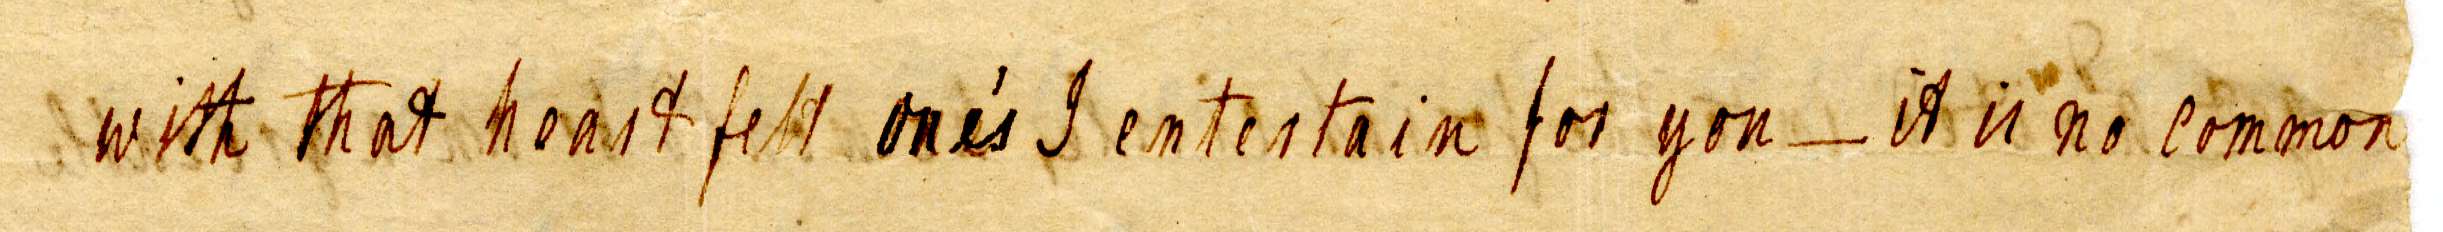with that heart felt one's I entertain for you-it is no common
